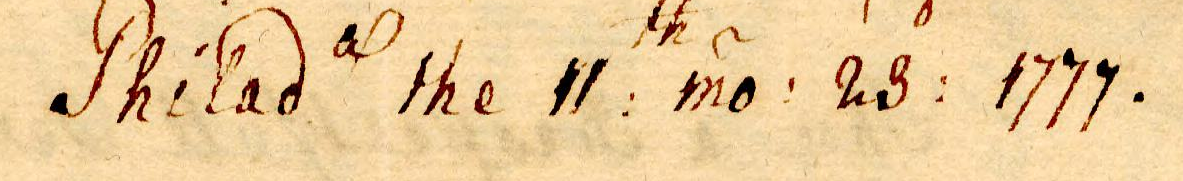Philad^a the 11:^th mo: 23^d: 1777.
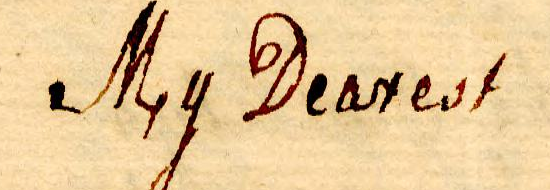My Dearest
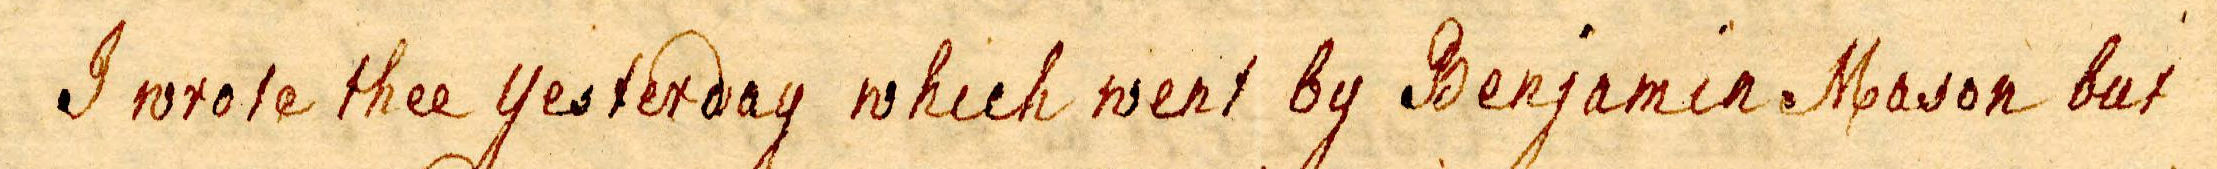I wrote thee yesterday which went by Benjamin Mason but
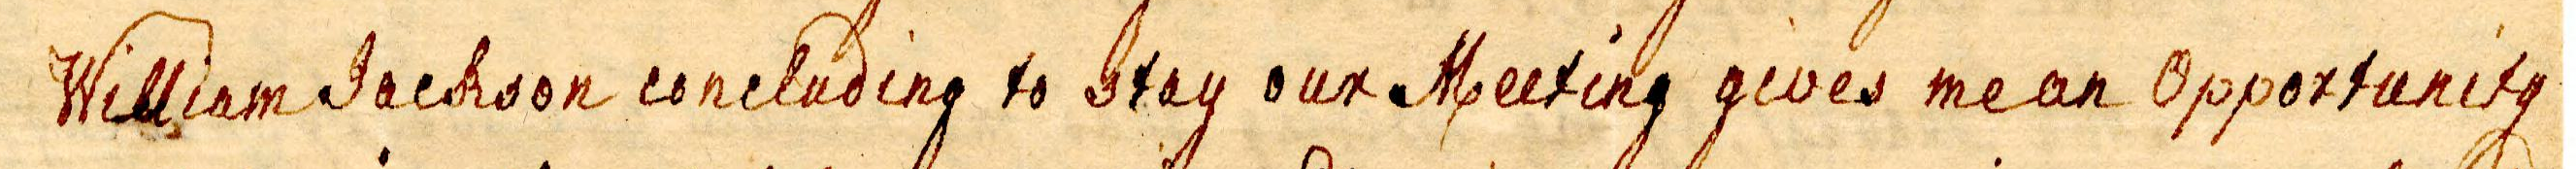William Jackson concluding to stay our Meeting gives me an Opportunity
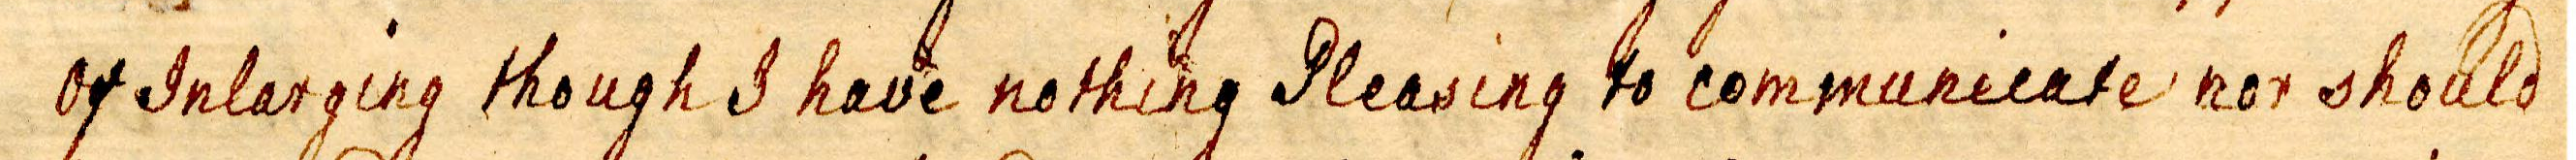of Inlarging though I have nothing Pleasing to communicate nor should
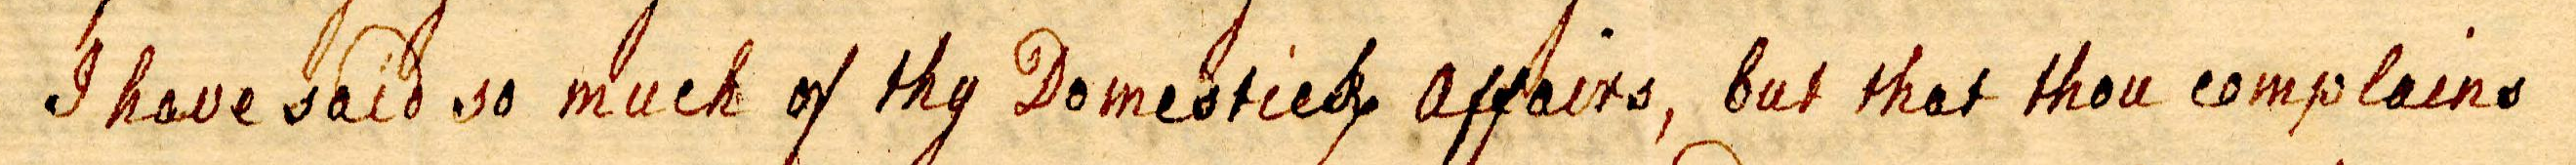I have said so much of thy Domestick affairs, but that thou complains
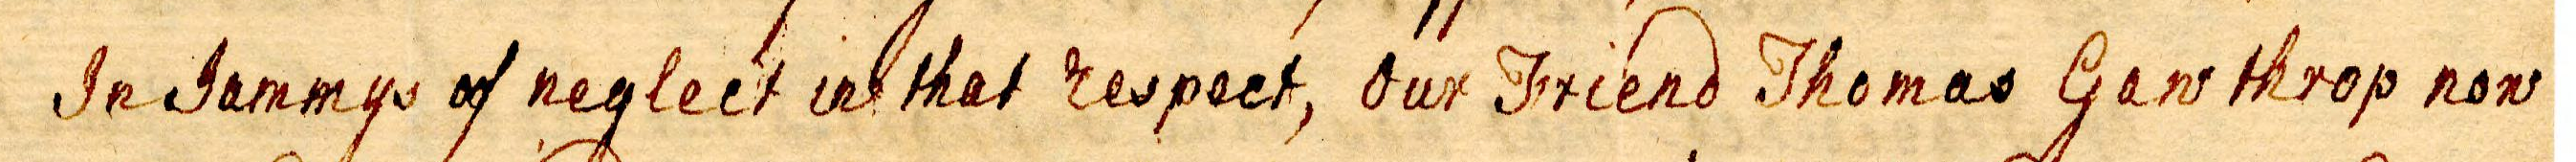In Jammys of neglect in that respect, our Friend Thomas Gawthrop now
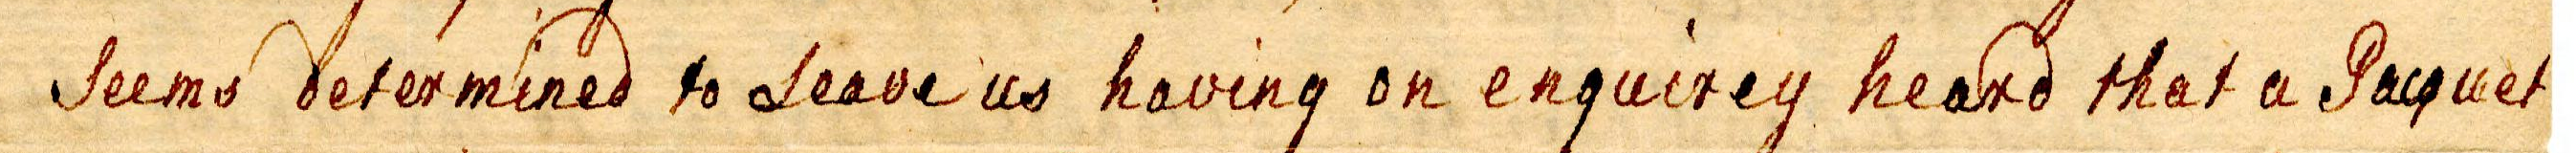seems determined to Leave us having on enquirey heard that a Pacquet
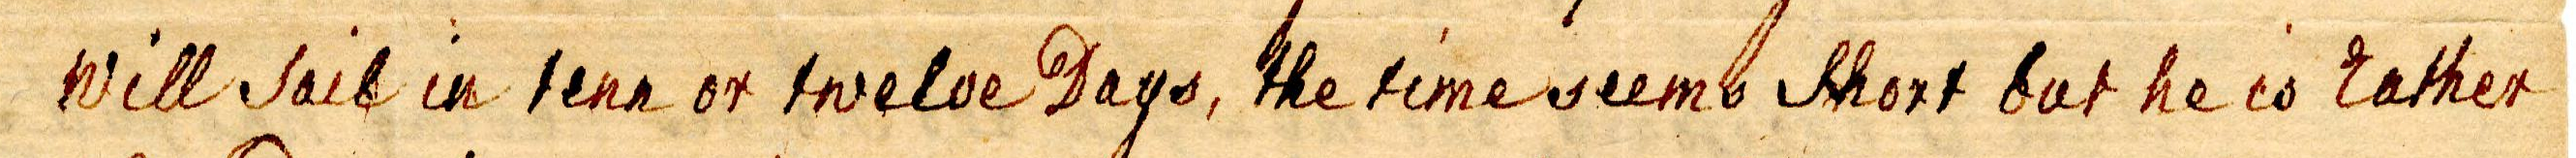will sail in tenn or twelve Days, the time seems short but he is rather
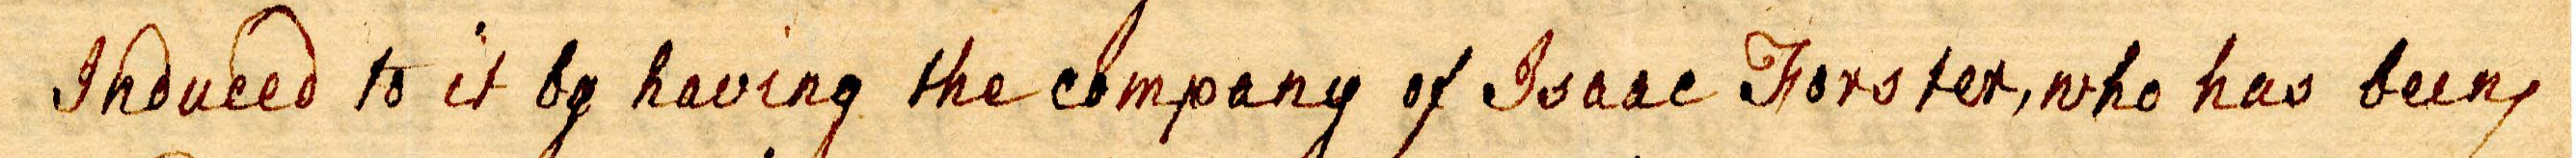Induced to it by having the company of Isaac Forster, who has been
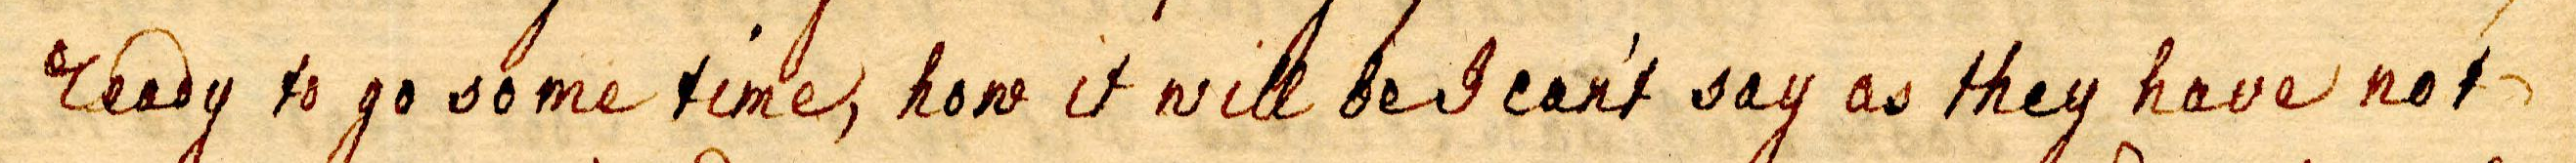ready to go some time, how it will be I can't say as they have not
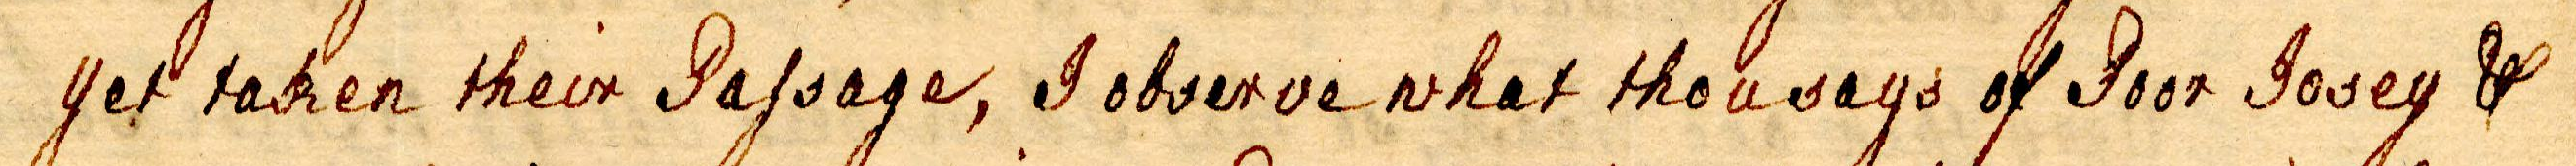yet taken their Passage, I observe what thou says of Poor Josey &
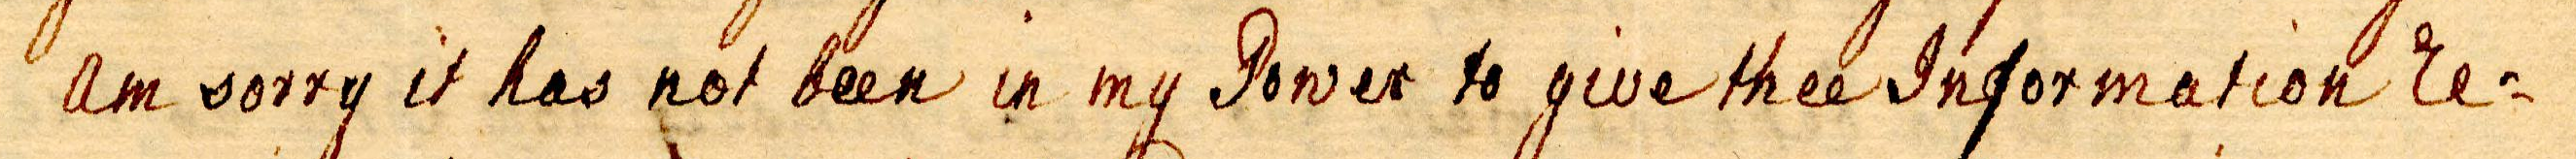am sorry it has not been in my Power to give thee Information re-
